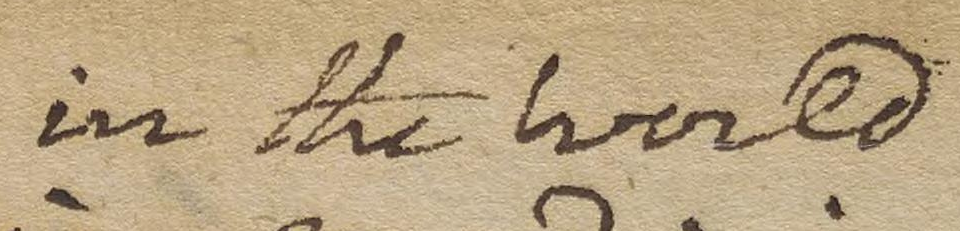in the world
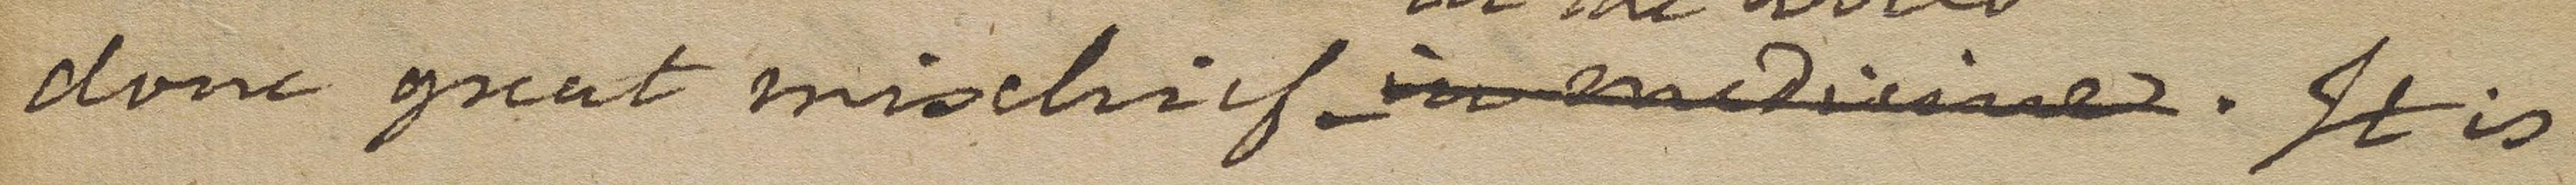done great mischief, in medicine ^ It is
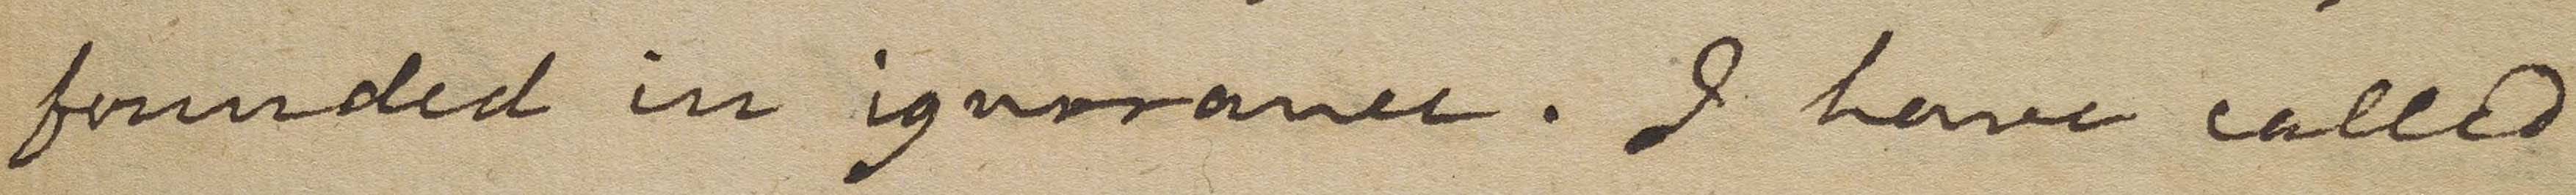founded in ignorance. I have called
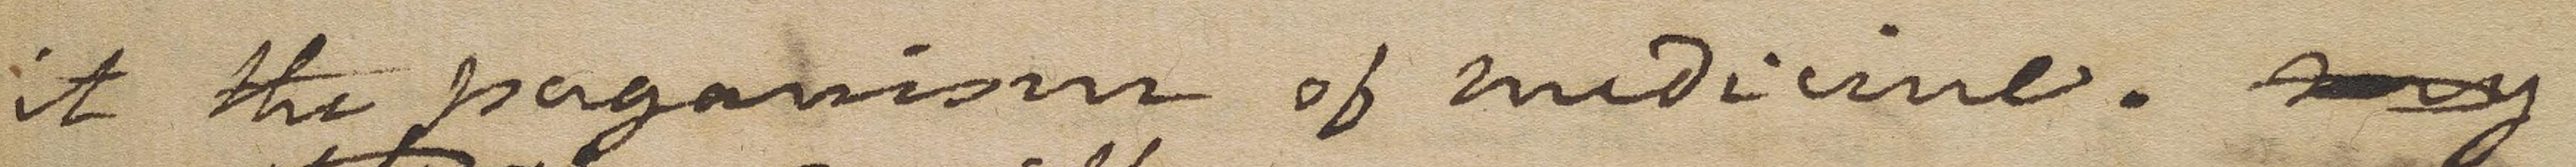it the paganism of medicine. [my]
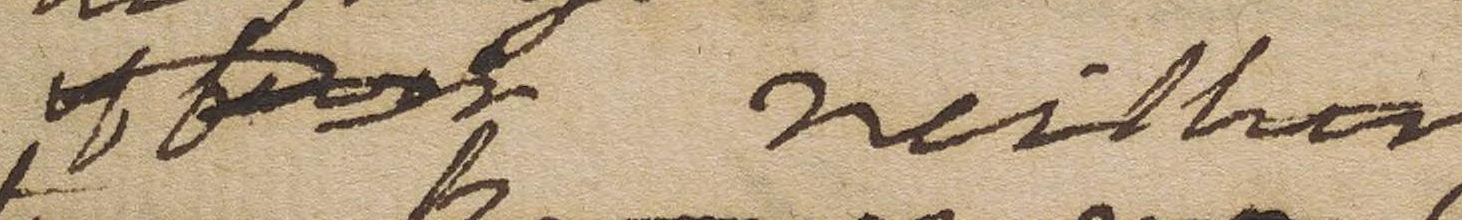[of first] neither
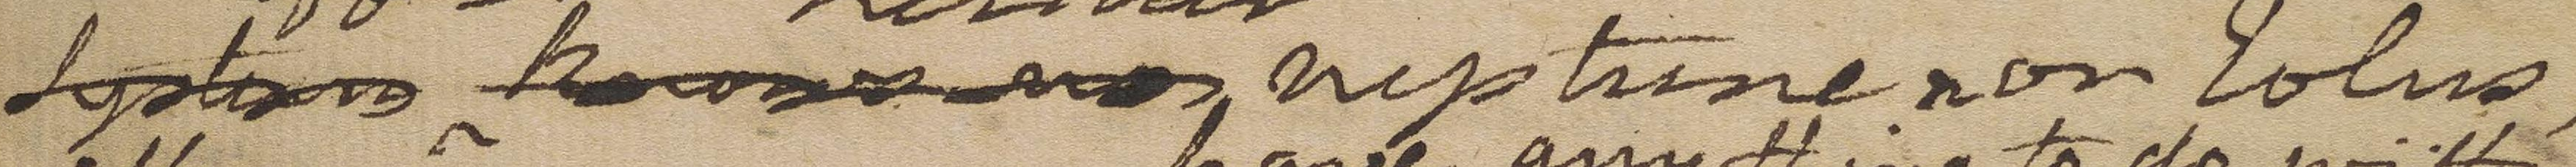[system] ^ [knows no] neptune nor Eolus
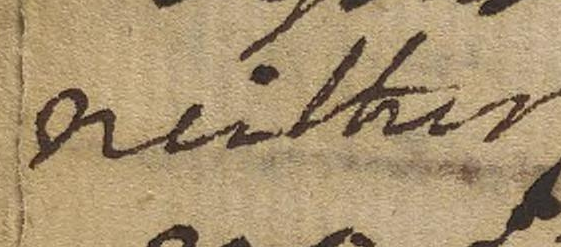neither
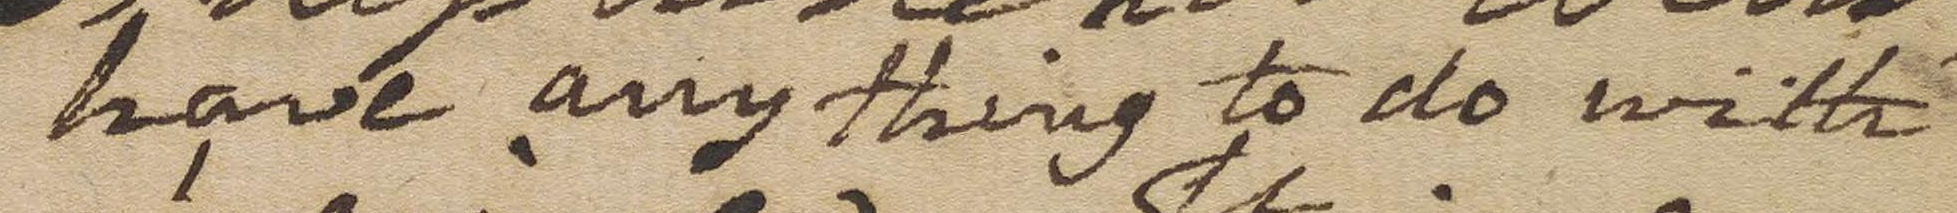have anything to do with
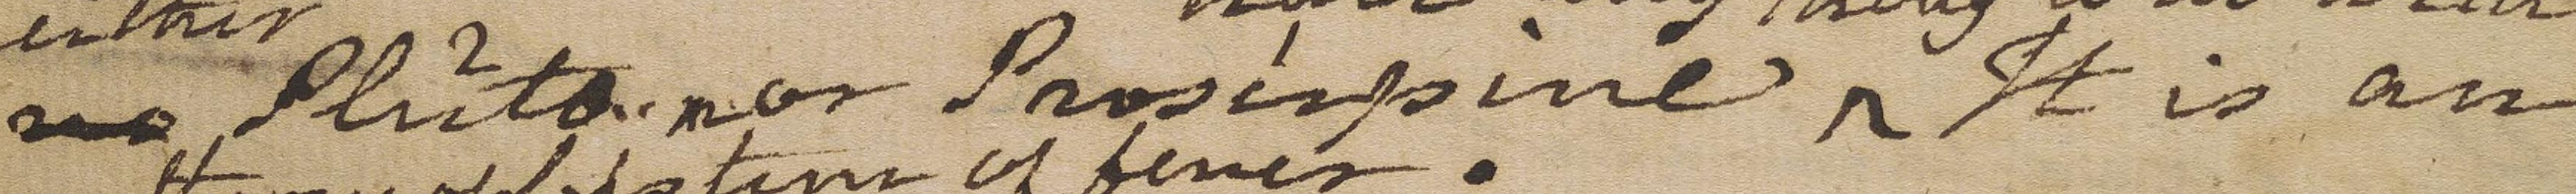[no] Plu^2to nor Proserpine ^ It is an
